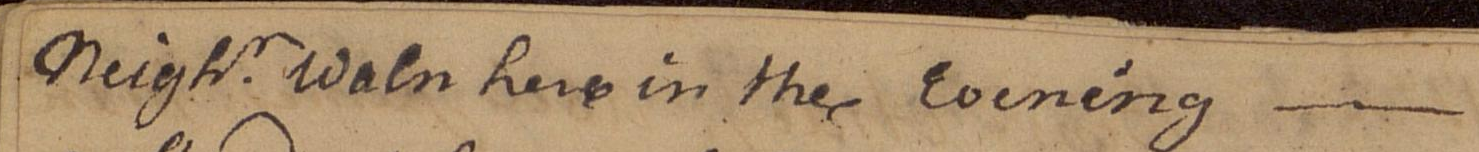Neigh^r. Waln here in the Evening-
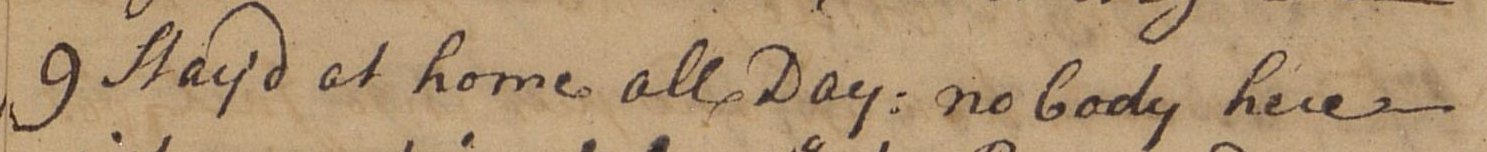9 Stay'd at home all Day: no body here -
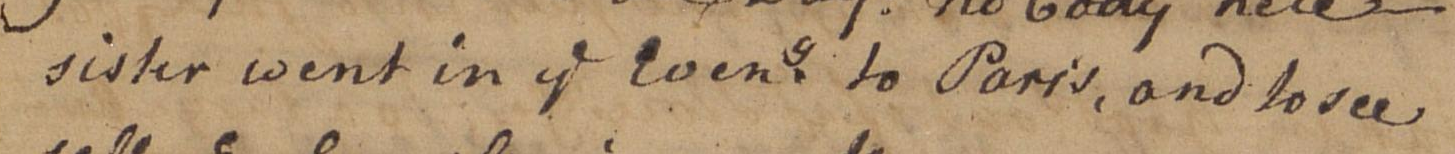sister went in y^e Even^g to Parr's, and to see
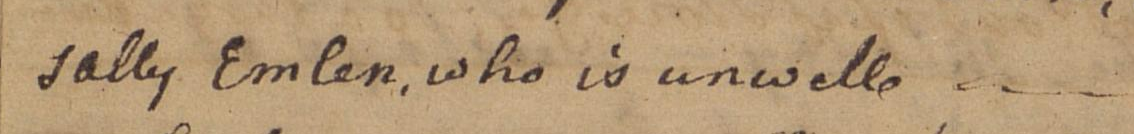Sally Emlen, who is unwell-
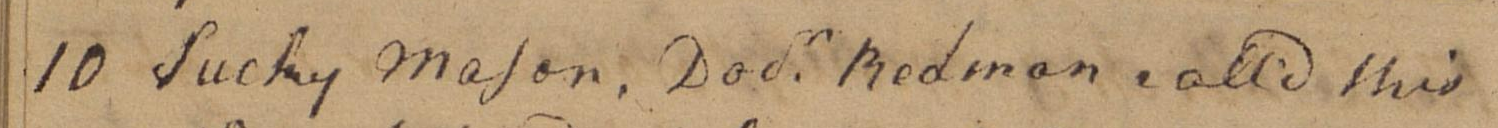10 Sucky Mason, Doc^r. Redman call'd this
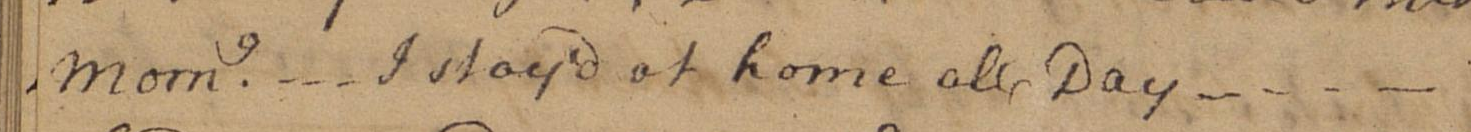Morn^g.- I stay'd at home all Day-
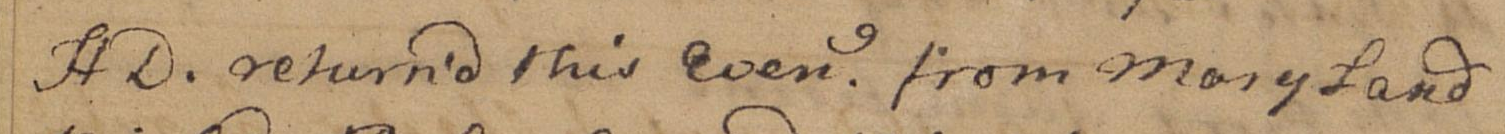HD. return'd this Even^g. from Mary Land
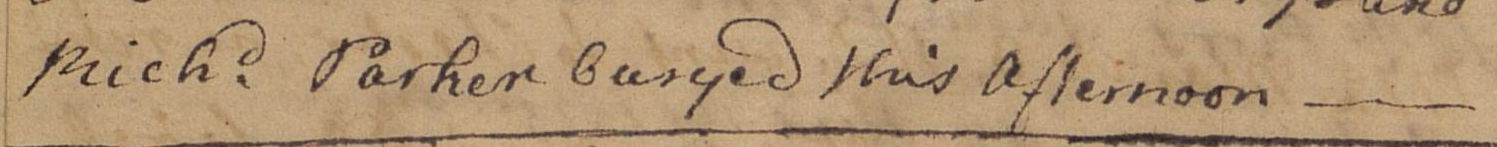Rich^d. Parker buryed this Afternoon-
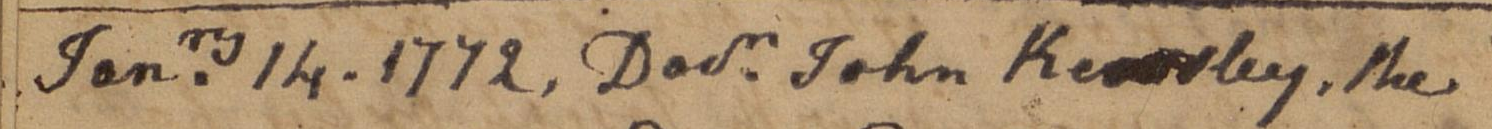Jan^ry. 14. 1772, Doc^r. John Kearsley, the
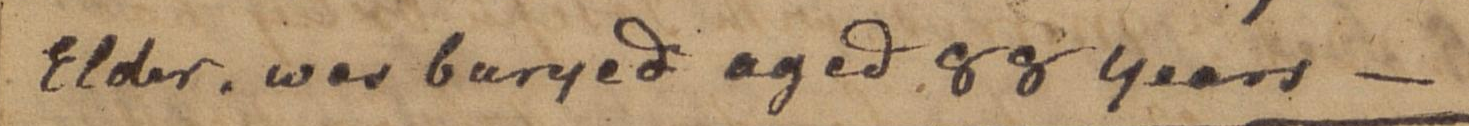Elder. was buryed aged 88 years-
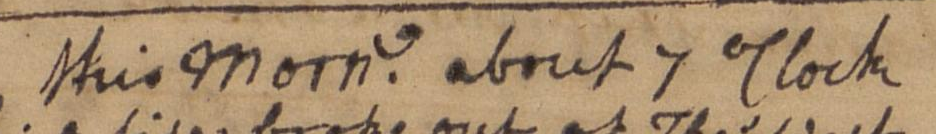this Morn^g. about 7 oClock
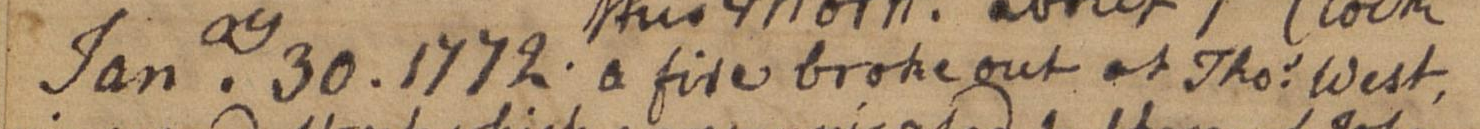Jan^ry. 30. 1772 a fire broke out at Tho^s West
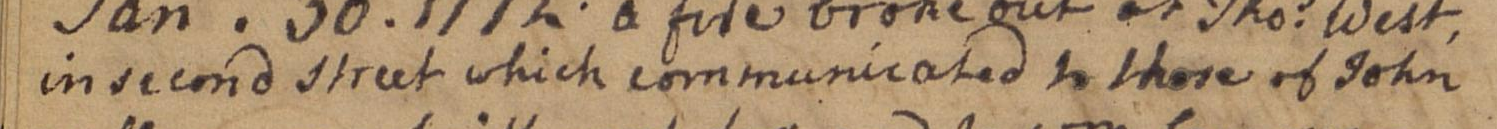in second street which communicated to these of John
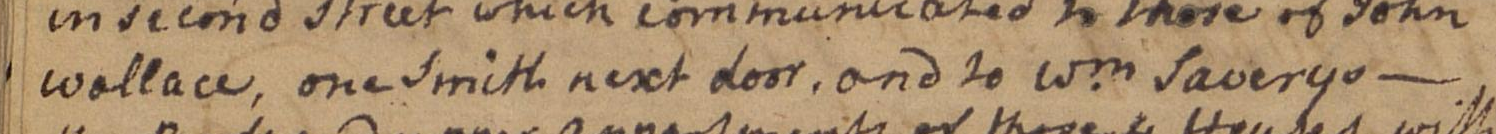Wallace, one Smith next door, and to W^m. Saverys-
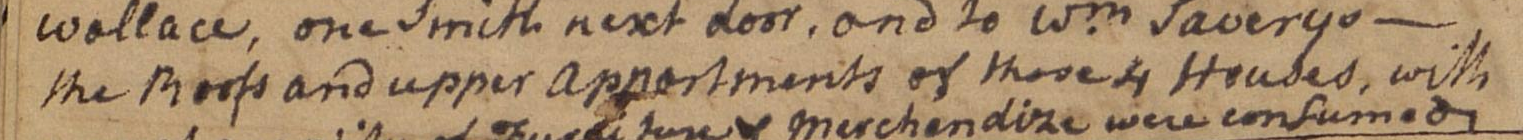the Roofs and upper Appartments of these 4 Houses, with
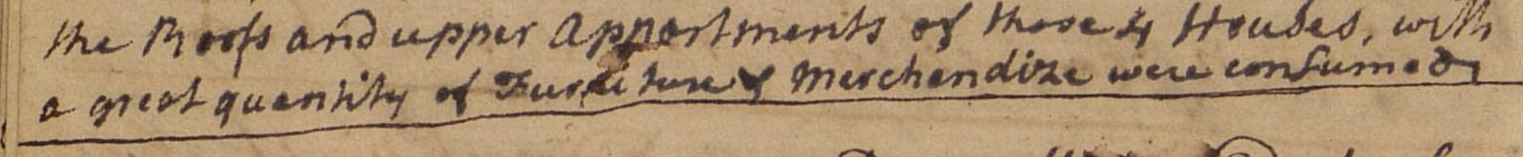a great quantity of Furniture & merchendize were consumed
